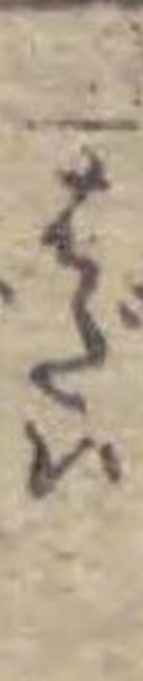はだは
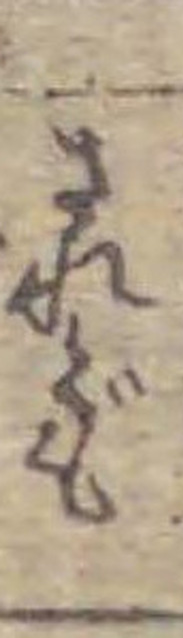されども
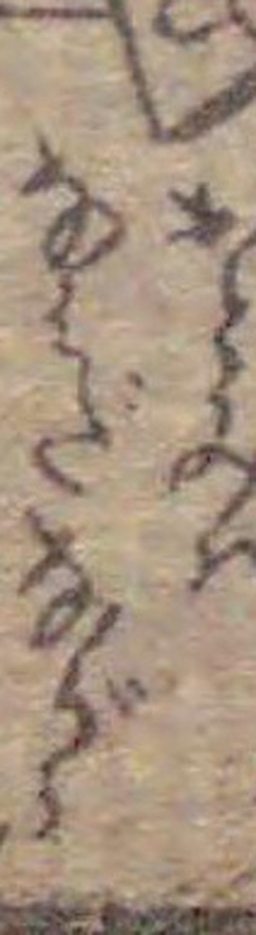なみだながら
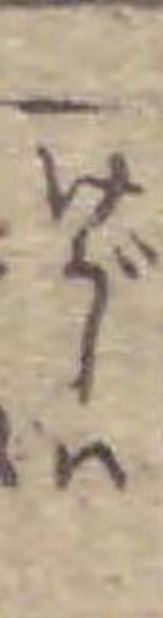けがしは
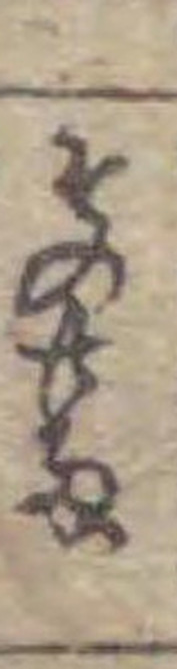その廿両
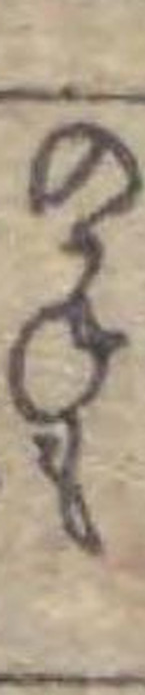のかねも
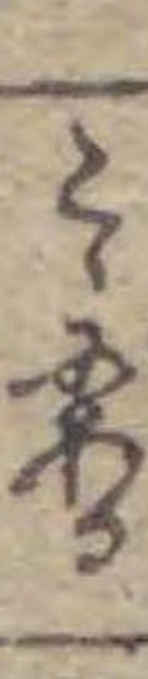こゝにある
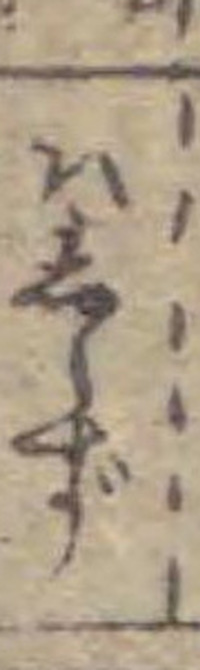はしらず
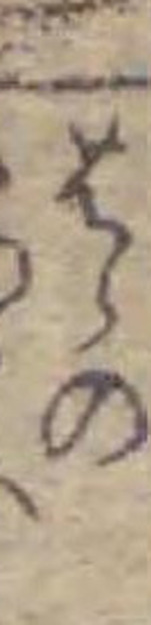はらの
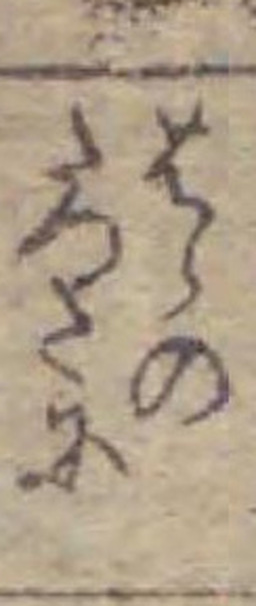たつたに
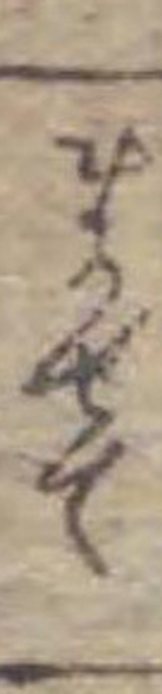まかせて
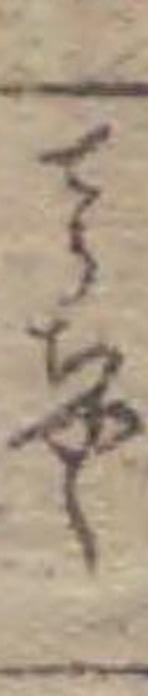てうちやく
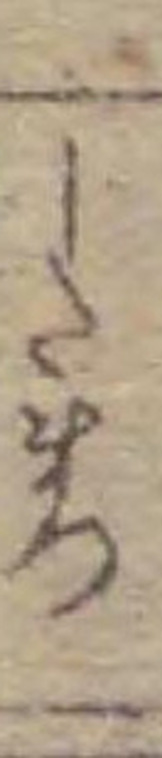したまつ
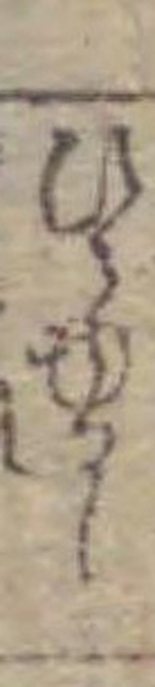ひらゆるし
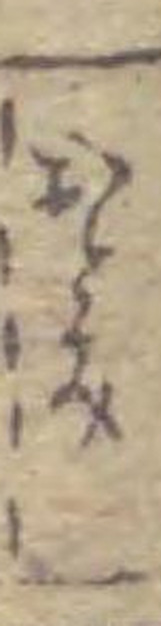おとみ
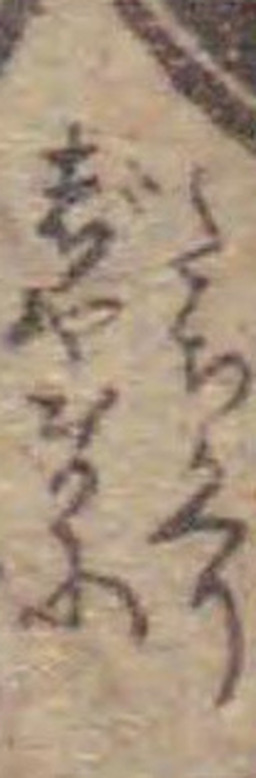じやまに
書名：芸者呼子鳥 : 2巻（松泉堂）
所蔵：国立国会図書館 National Diet Library, JAPAN
